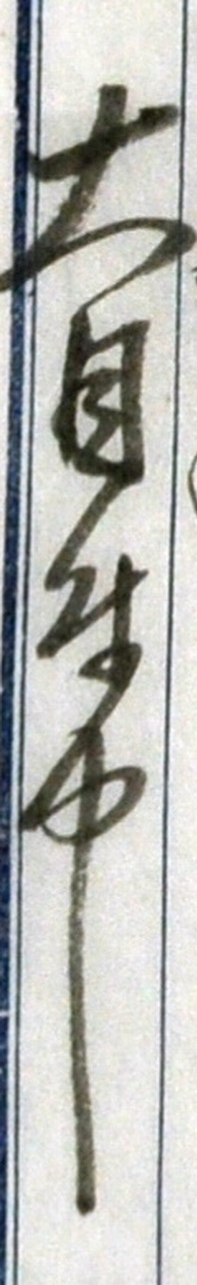大目付中
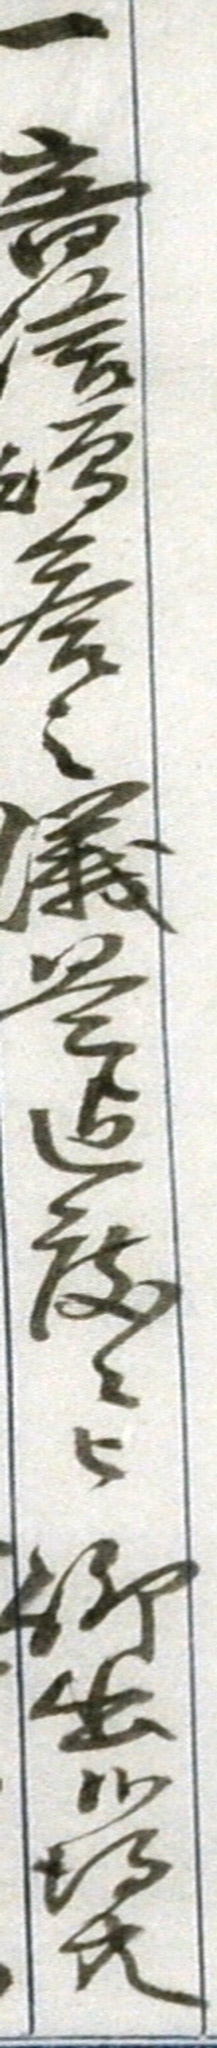一音信贈答之儀是迄度々被仰出候得共
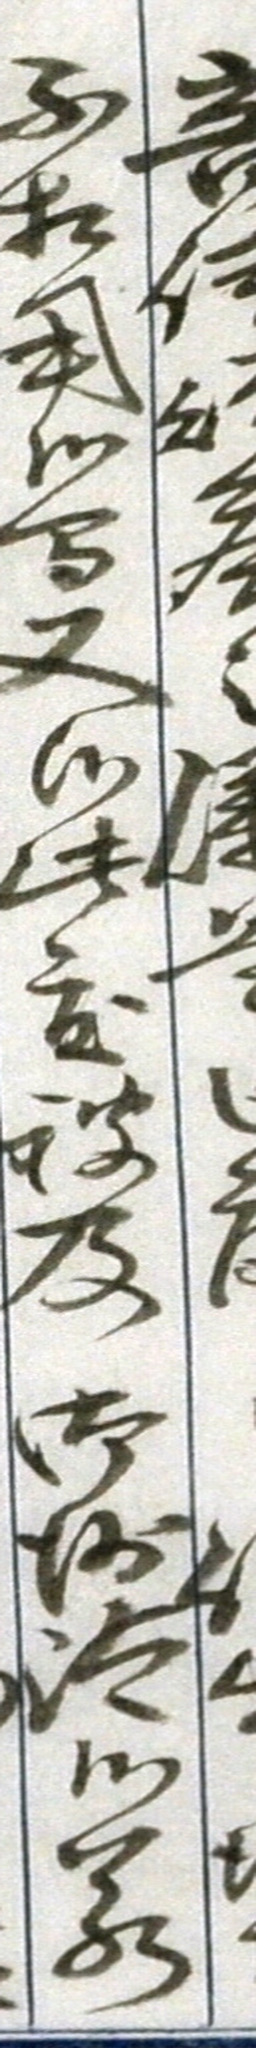不相用候間又候此度被及御沙汰候若
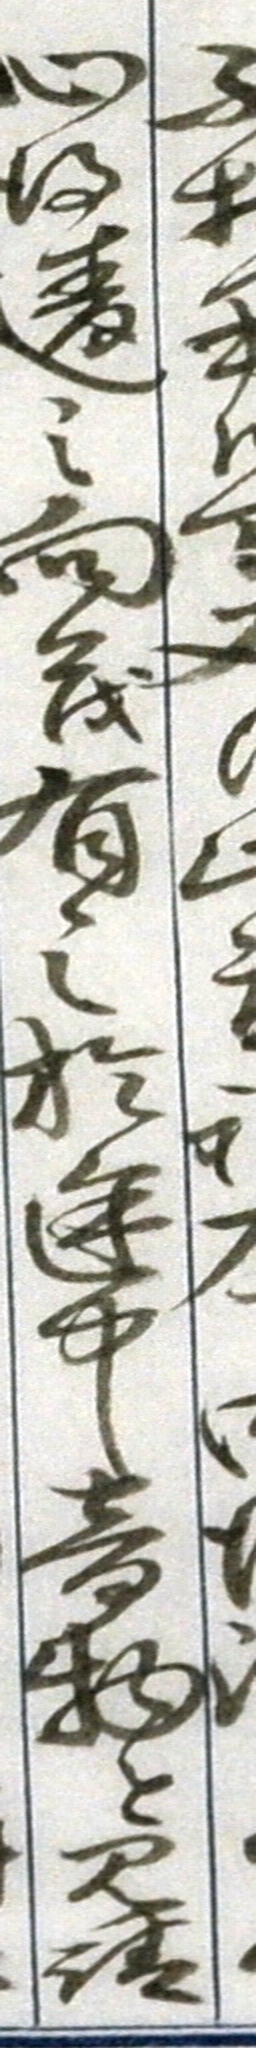心得違之向も有之於途中音物と見請
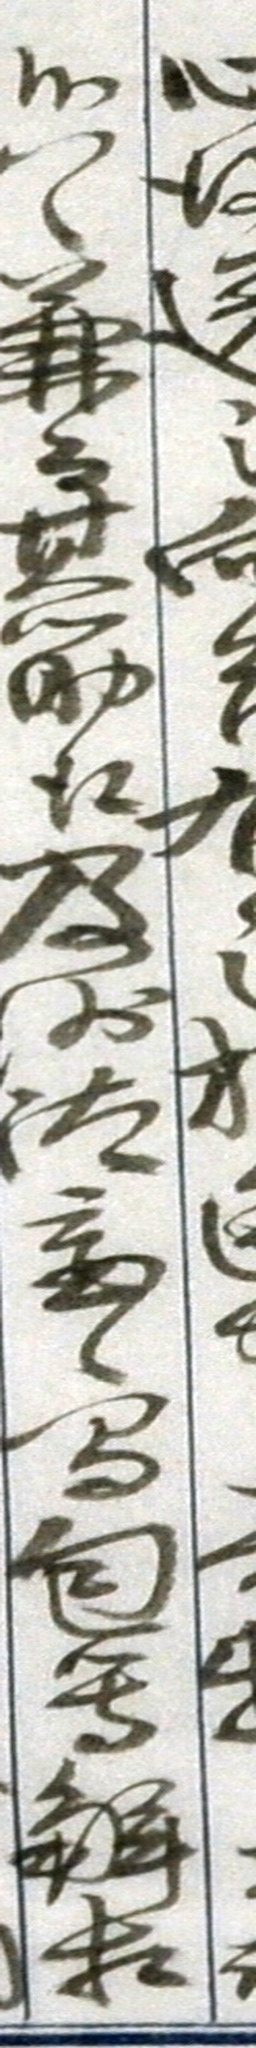候ハヽ兼而其筋江及沙汰置候間包等解相
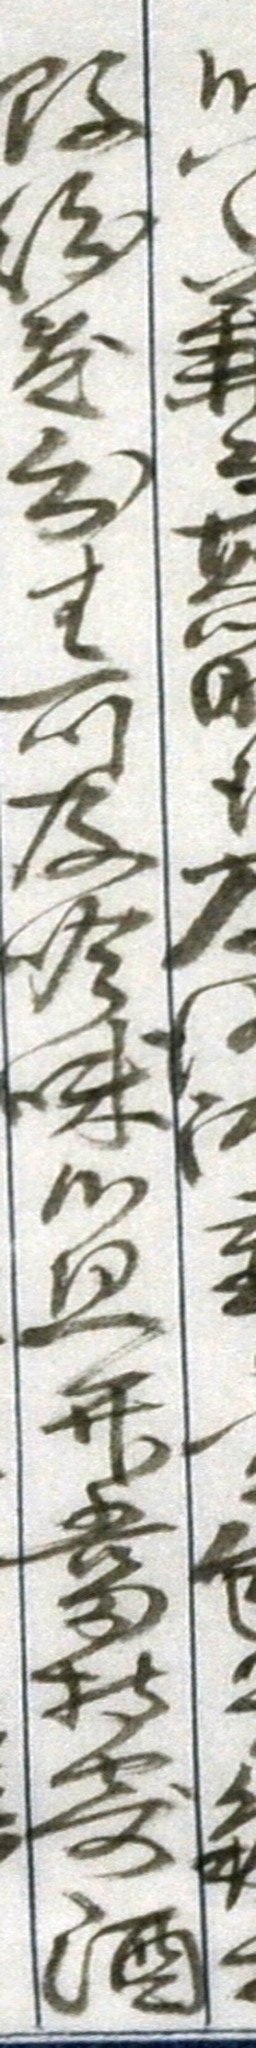改紛敷分は可及吟味候且弁当持寄酒
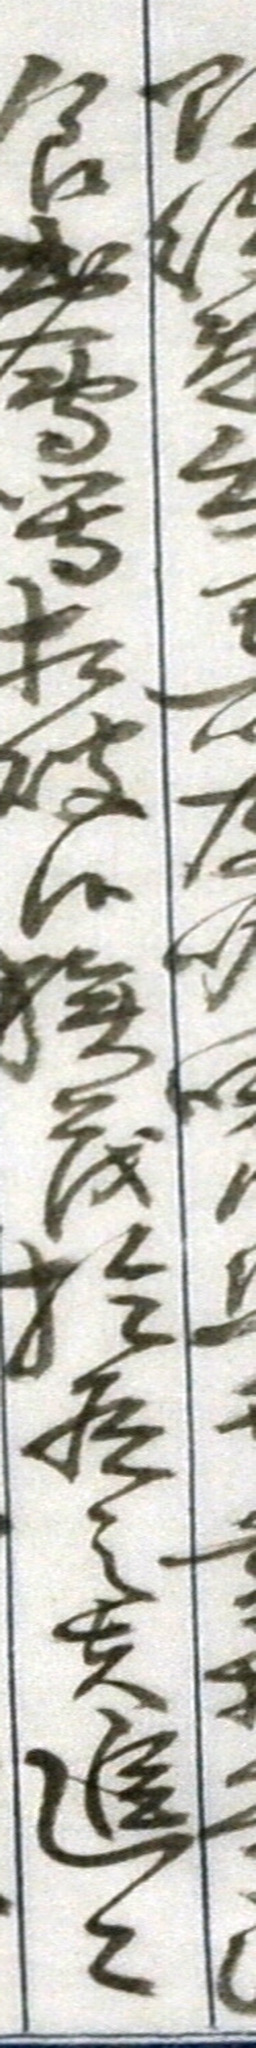食出会等相破候族も於有之は追々
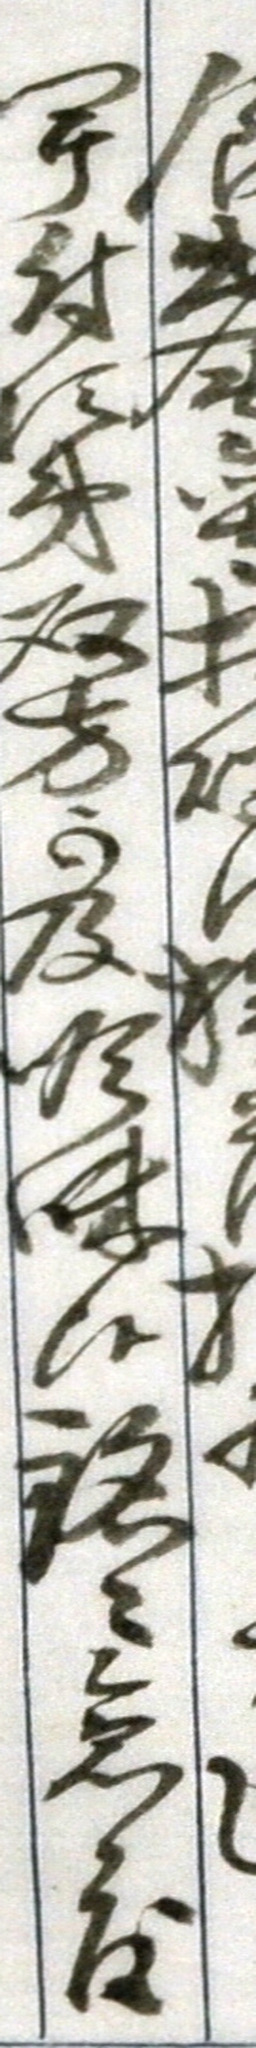聞付次第双方可及吟味候銘々急度
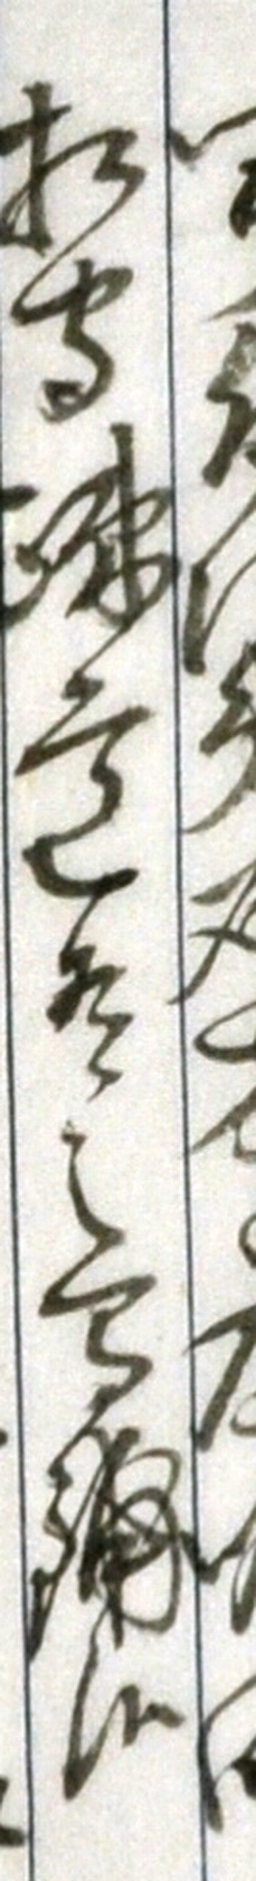相守疎意有之間舗候
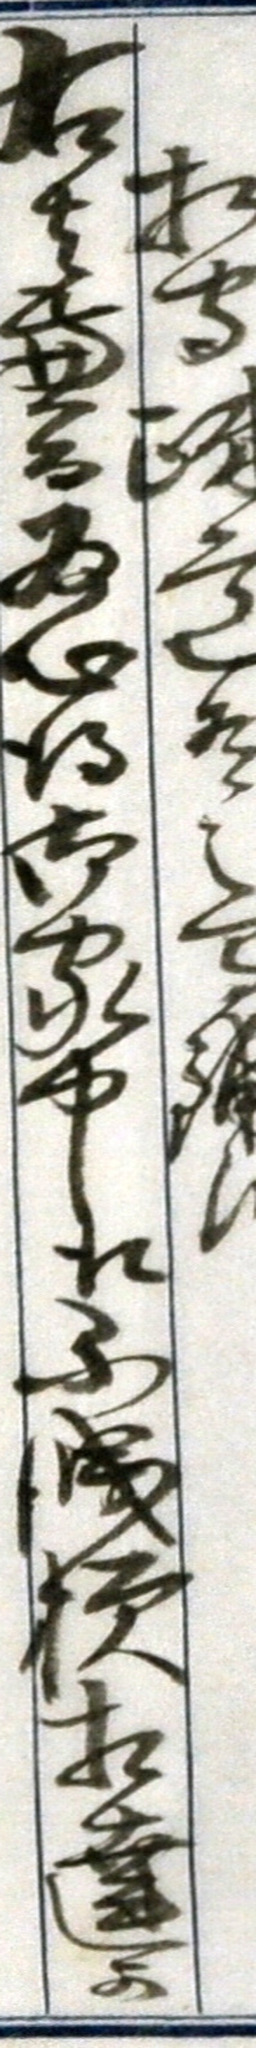右は兼而為心得御家中江不洩様相達可
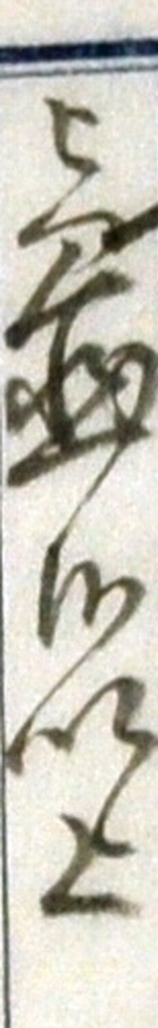被置候以上
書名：御倹約被仰出書
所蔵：伊那市立高遠町図書館・合同会社AMANE
